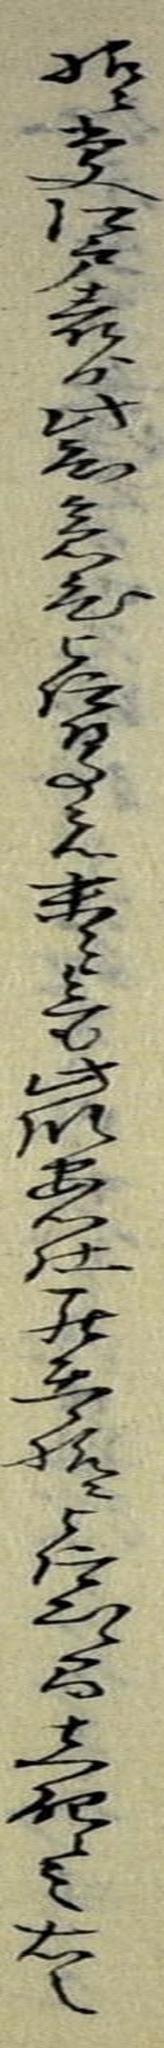様ニ尚又江戸表ゟ此度急度被仰付事ニ候末々迄も此段安心仕罷在候様ニ被仰出候間支配々々へ右之
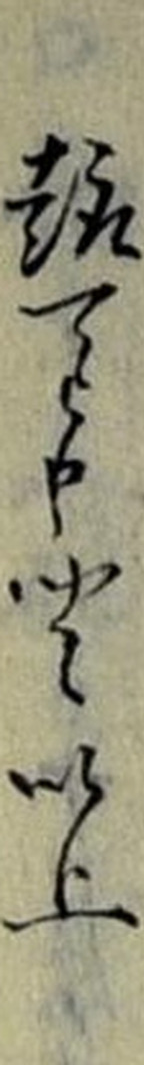趣可被申聞候以上
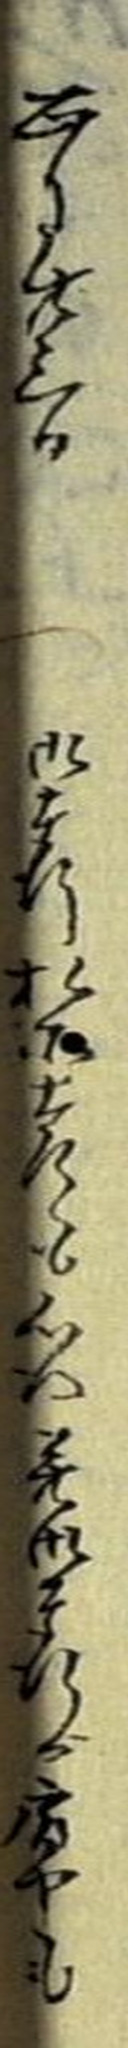正月廿三日御奉行札所奉行へも心得并御奉行ゟ府中へも
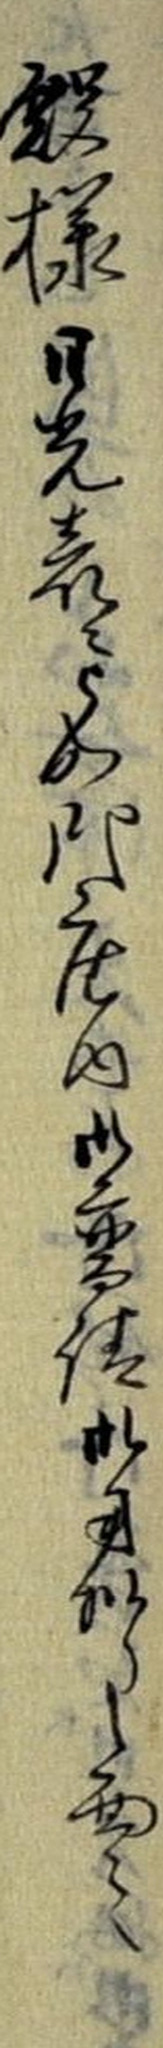殿様日光表ニ被成御座内御普請御用掛り之面々へ
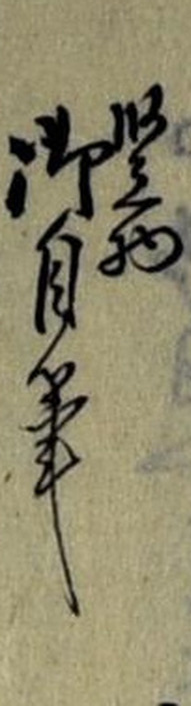御自筆
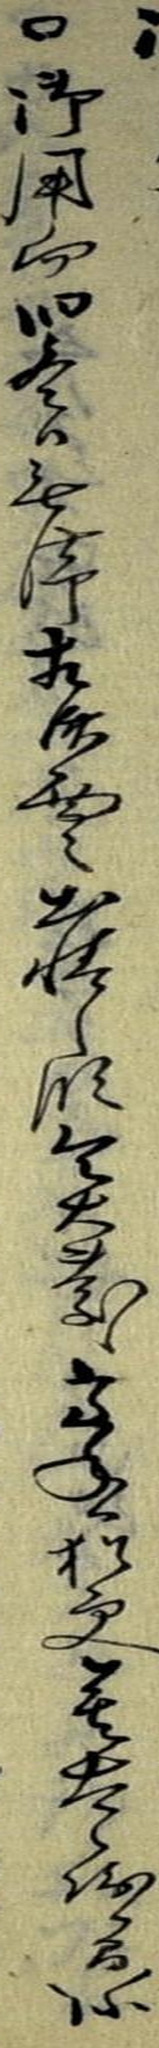〇御用向旧冬ニハ無滞相済面々出情之段令大慶候当年ハ猶更莫太之儀候間弥
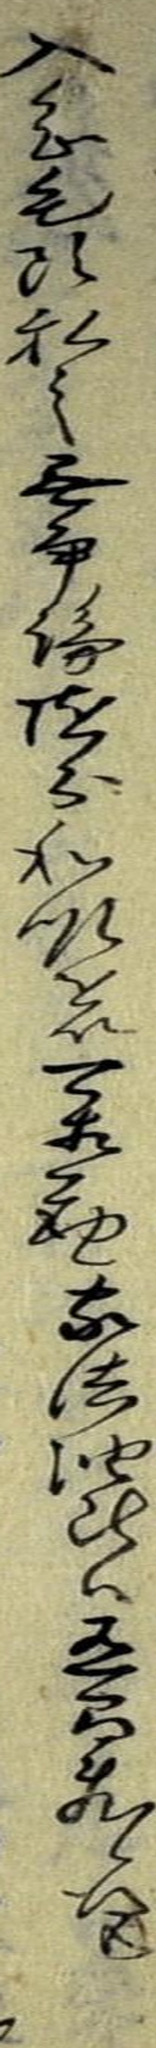入念毛頭私之無争論随分和順を以可相勤候家法油断ハ有間敷候得共
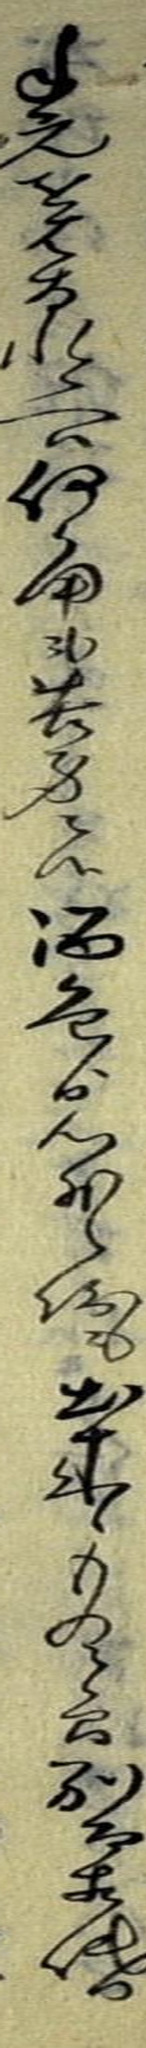手元をはなれ候ヘハ何角も苦身ニ候酒色ゟ心外之儀も出来候ものニ候間別而相替
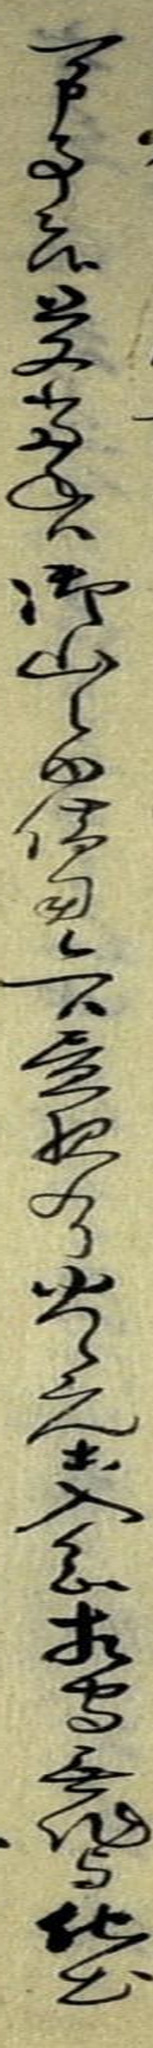可申事ニ候且又当年ハ御山之内借用候ヘハ昼夜入り火之元等入念相守無作与他出
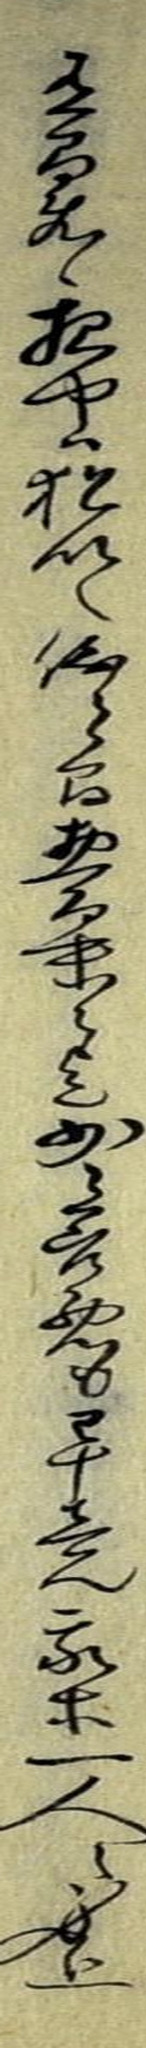有間敷候夜中ハ猶以之儀ニ候間惣而末々迄少々善悪も畢竟我等一人之身上
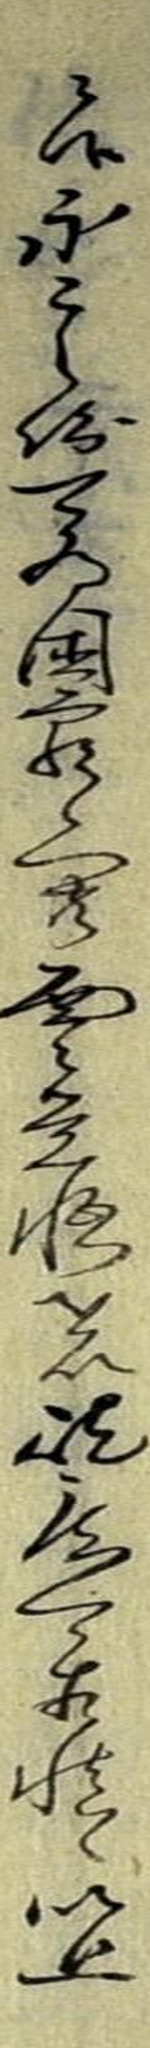ニ候永々之儀可為困窮候へ共面々覚悟を以屹度可相慎候以上
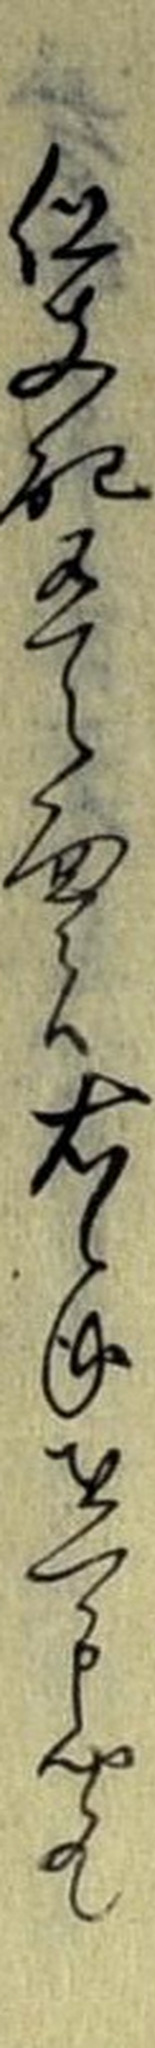但支配有之面々ハ右之趣を可申聞候
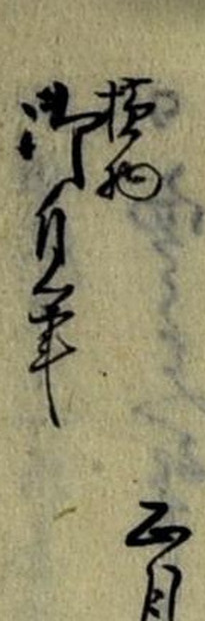御自筆
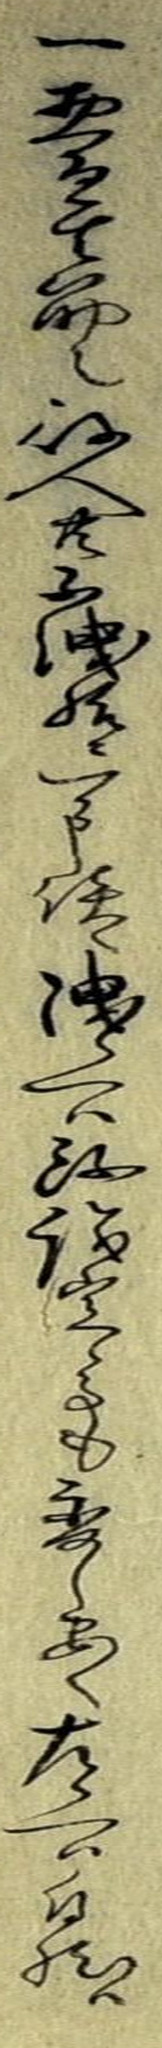一惣而其筋之役人共不洩様ニ可申談候洩候ヘハ致議定候事も変し安く左候ヘハ自然ハ
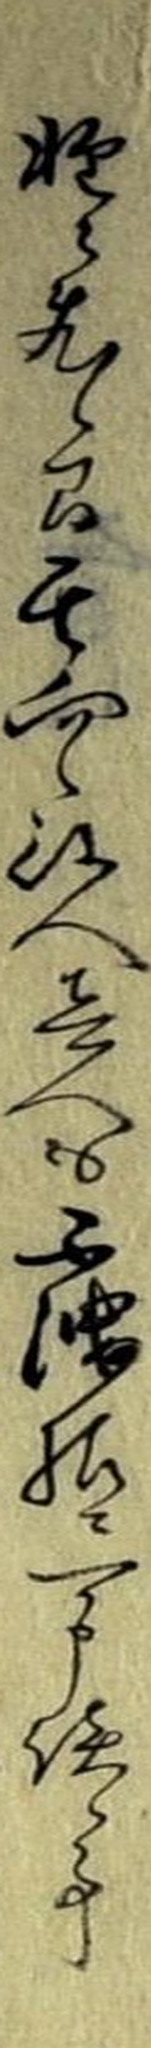軽々敷候間其向へ役人壱人も不洩様ニ可申談候事
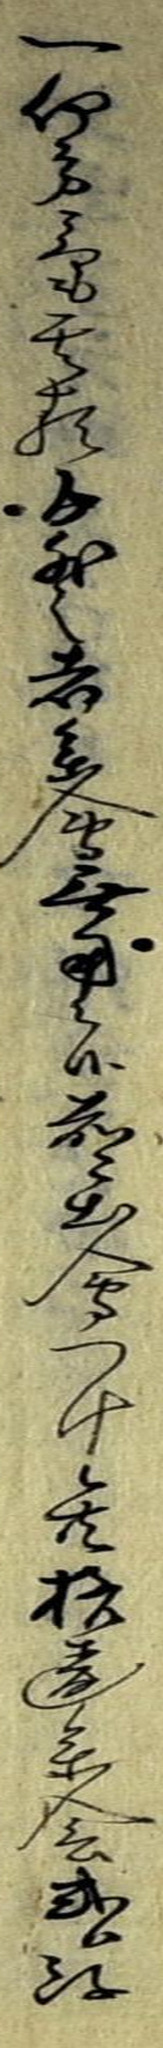一何方ニ而も其類ゟ外之者参会無用ニ候前々出会つけ候共格違参会或ハ致
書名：命令之部 一
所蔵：福井県文書館 Fukui Prefectural Archives
